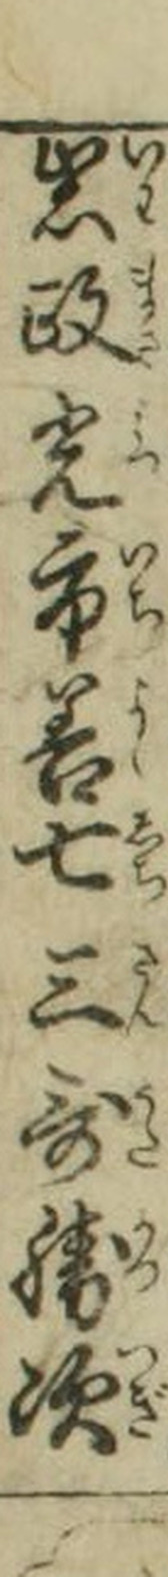岩政光市善七三哥勝次
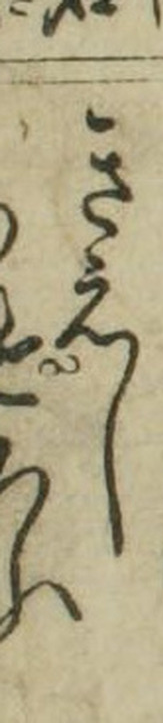きえし
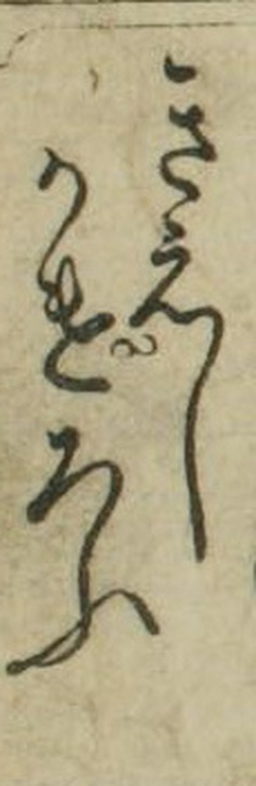かげろふ

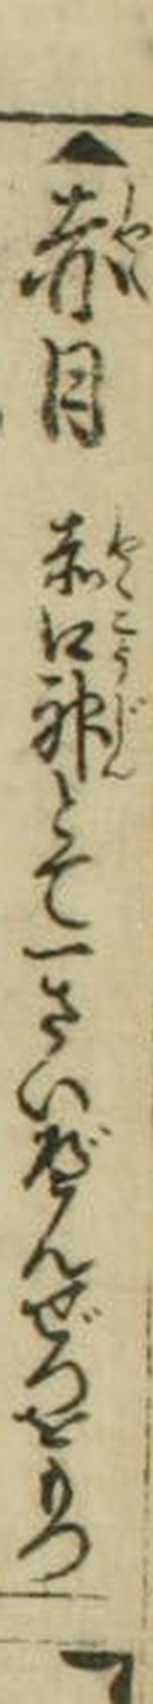▲赤日赤口神とて一さいべんぜつをもつ
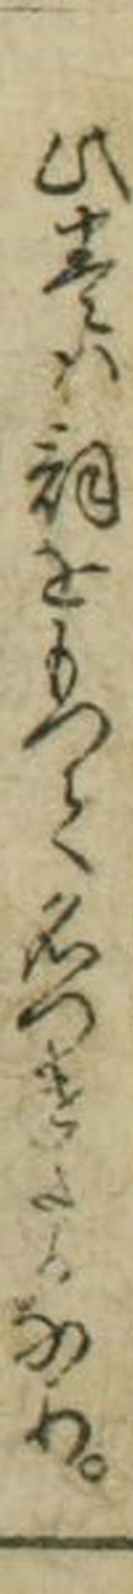此巻は詞をもつて名つけたるなり。
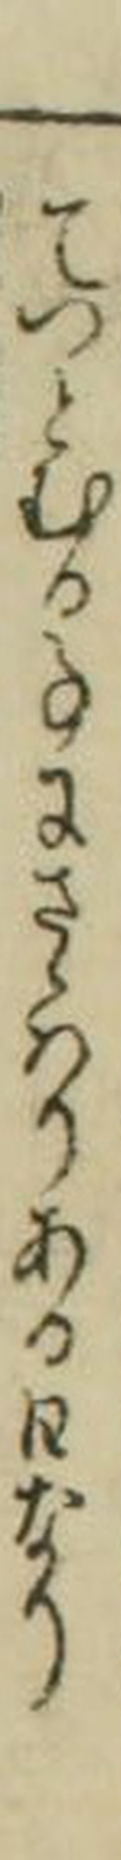てつとむる事にさゝはりある日なり
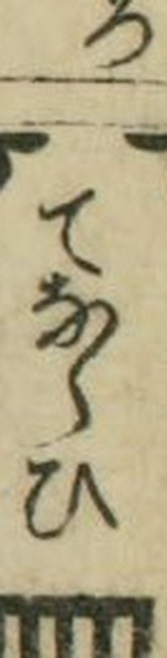てならひ
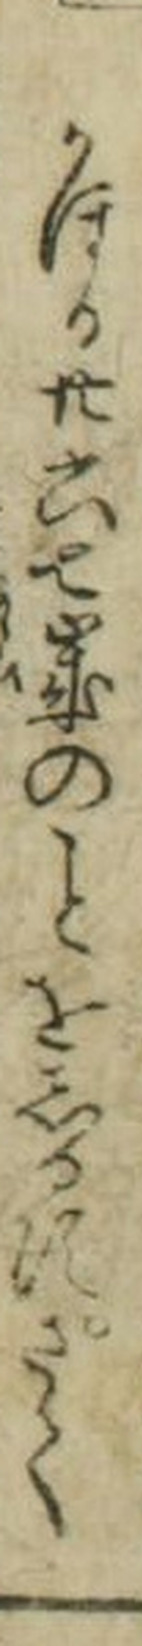かほる廿六七歳のことをしるす。さて
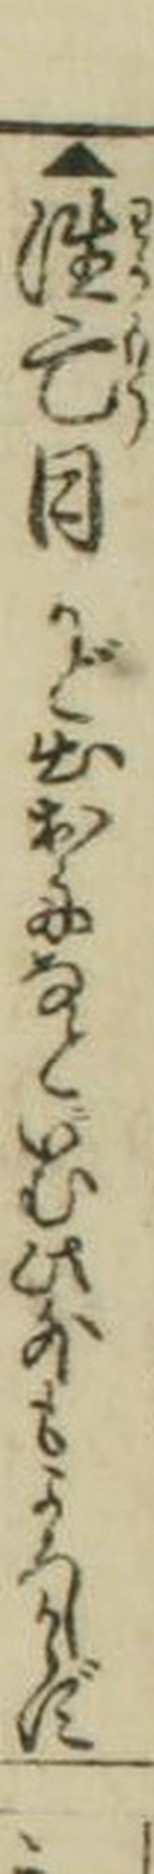▲往亡日かど出お舟なとにいむ此外もよろしからず
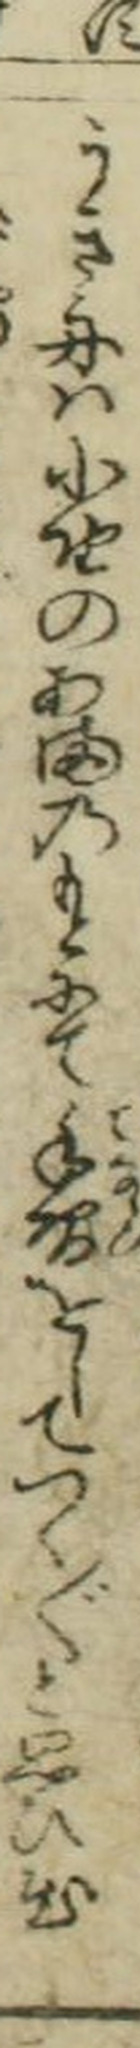うき舟は小野のあまのもとにて手習をしてつく〴〵と思ひ出
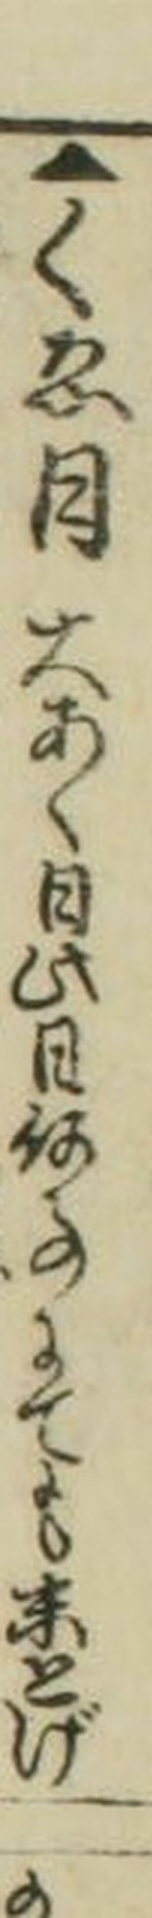▲くゑ日大あく日此日何事にても末とげ
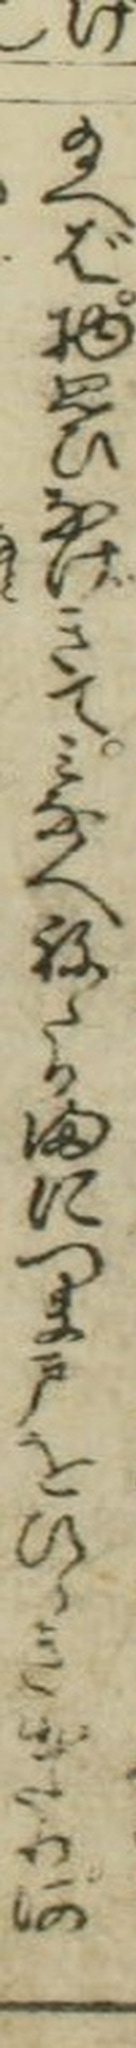給へば。物思ひなげきて。みな人ねたるまにつま戸をひらき出たり。河
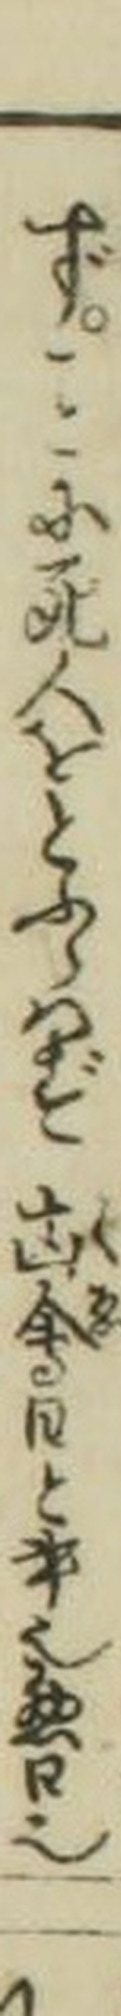ず。ことに死人をとふらはず凶会日と書也悪日也
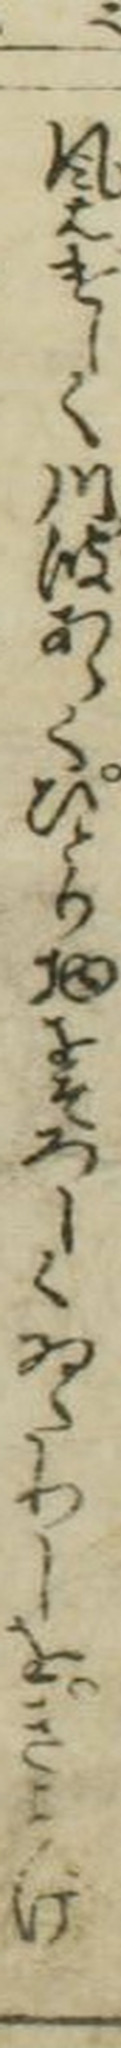風はげしく川波あらく。ひとり物をそろしく居たりしを。きよげ
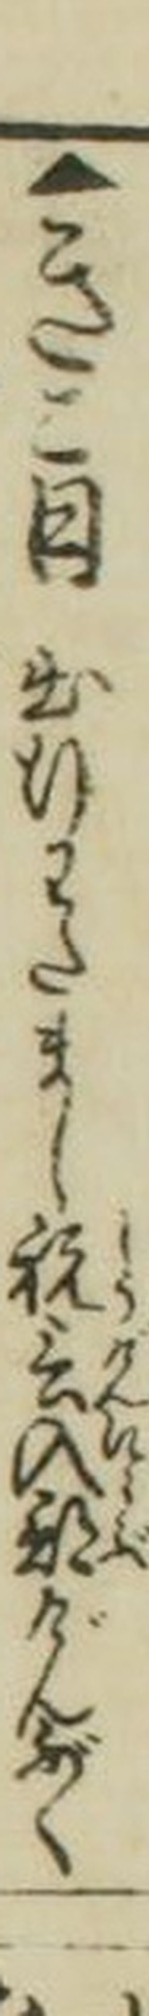▲きこ日出行わたまし祝言入部げんぶく
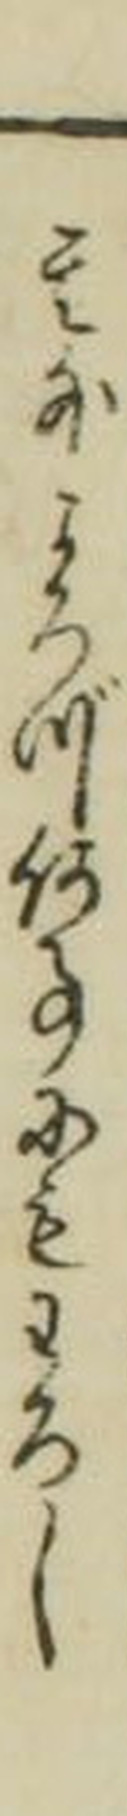其外よろづ何事にもわろし
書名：女源氏教訓鑑
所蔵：東京学芸大学附属図書館
